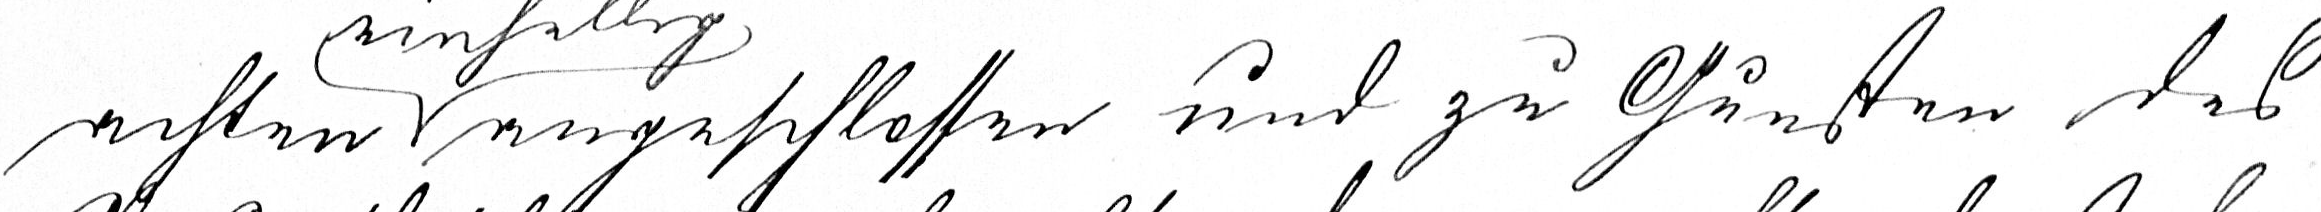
achten angeschlossen und zu Gunsten des
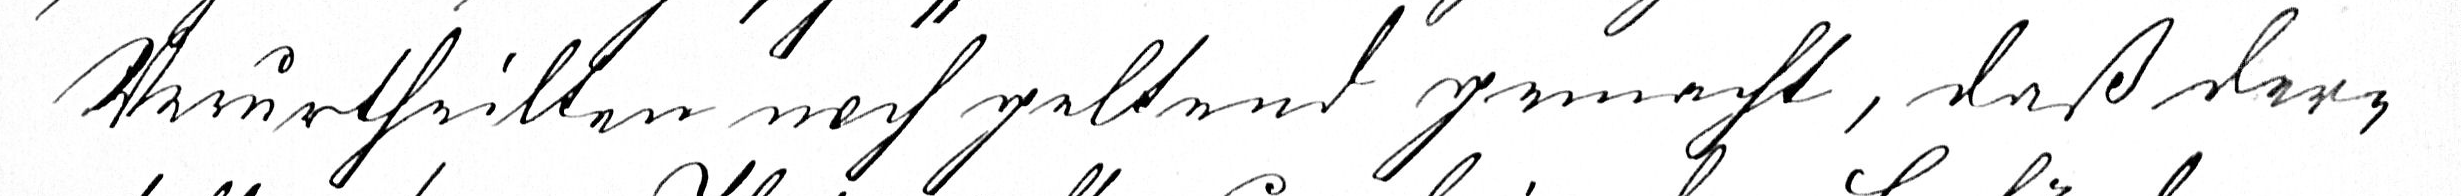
Verurtheilten noch geltend gemacht, daß der¬
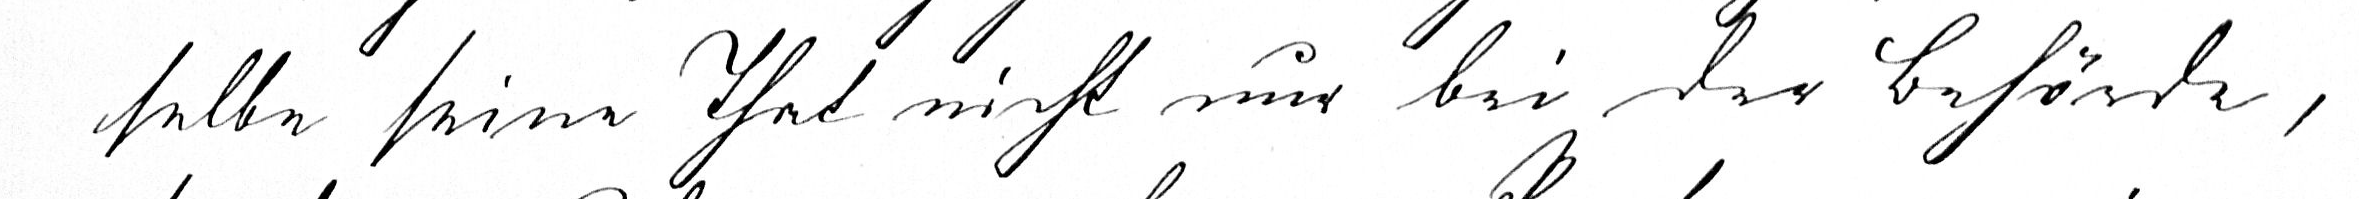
selbe seine That nicht nur bei der Behörde,
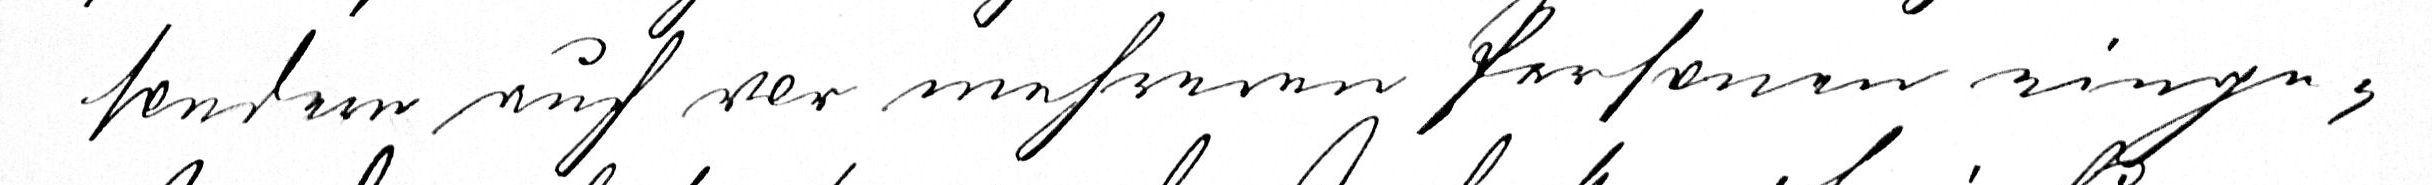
sondern auf vor mehreren Personen einge¬
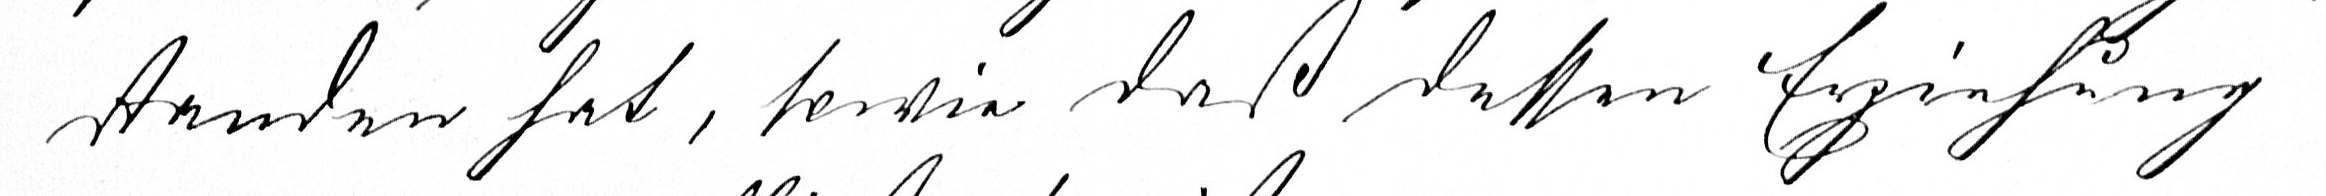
standen hat, sowie daß dessen Erziehung
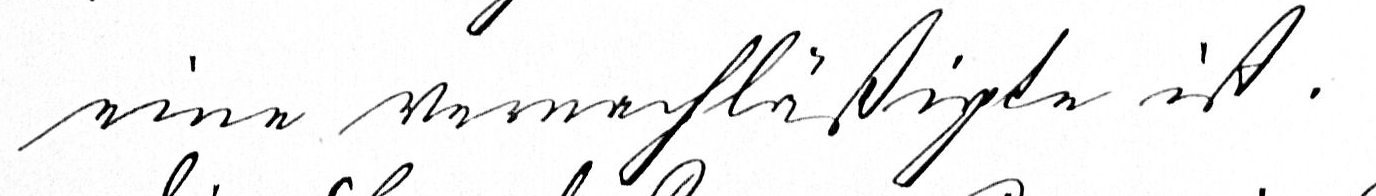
eine vernachläßigte ist.
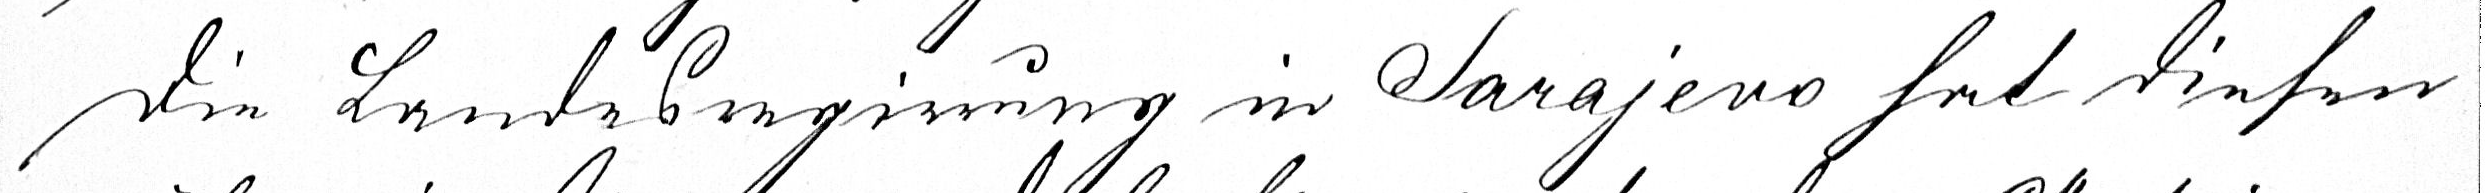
Die Landesregierung in Sarajevo hat diesen
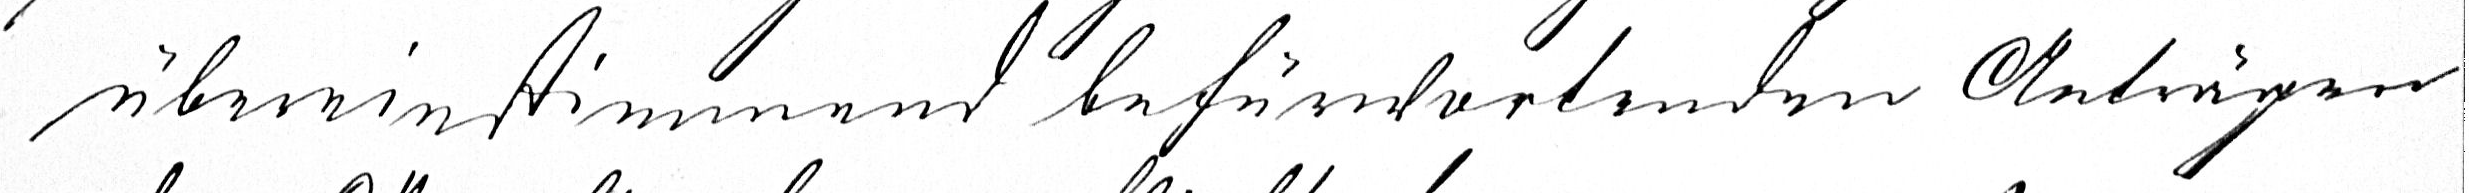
übereinstimmend befürwortenden Anträgen
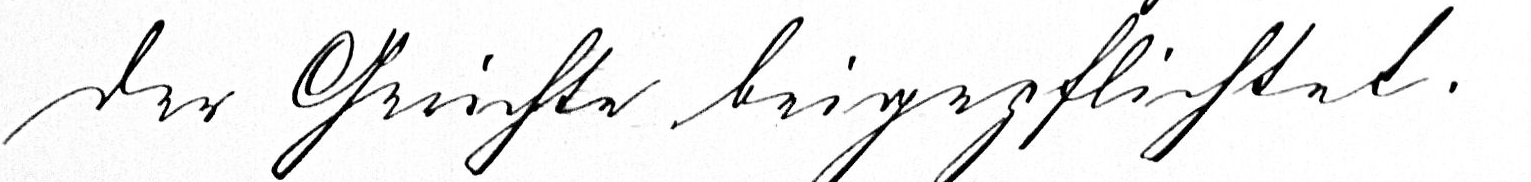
der Gerichte beigepflichtet.
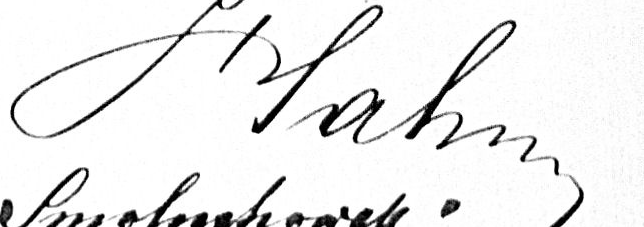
Hahn
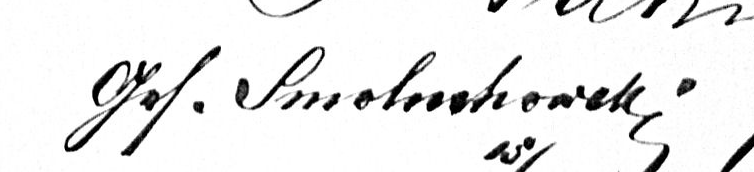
Ges. Smolmtrowck
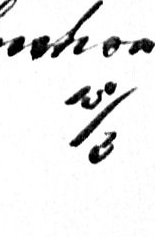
15/3
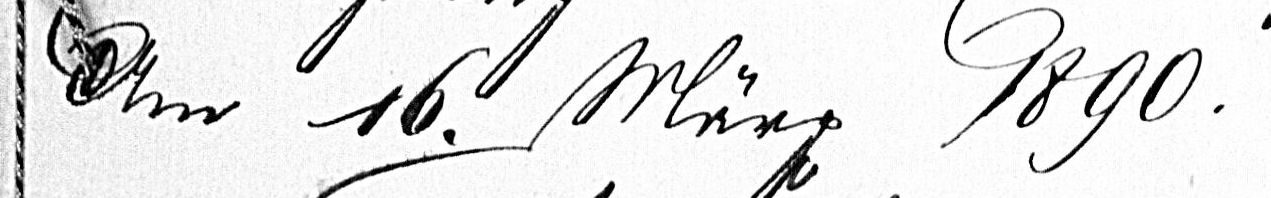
Am 16. März. 1890.
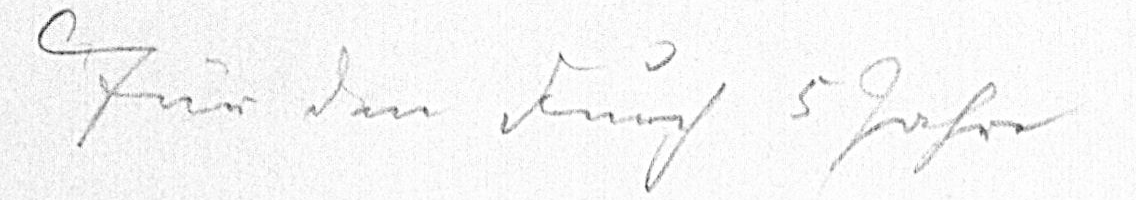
Zur den Furch 5 Jahre
